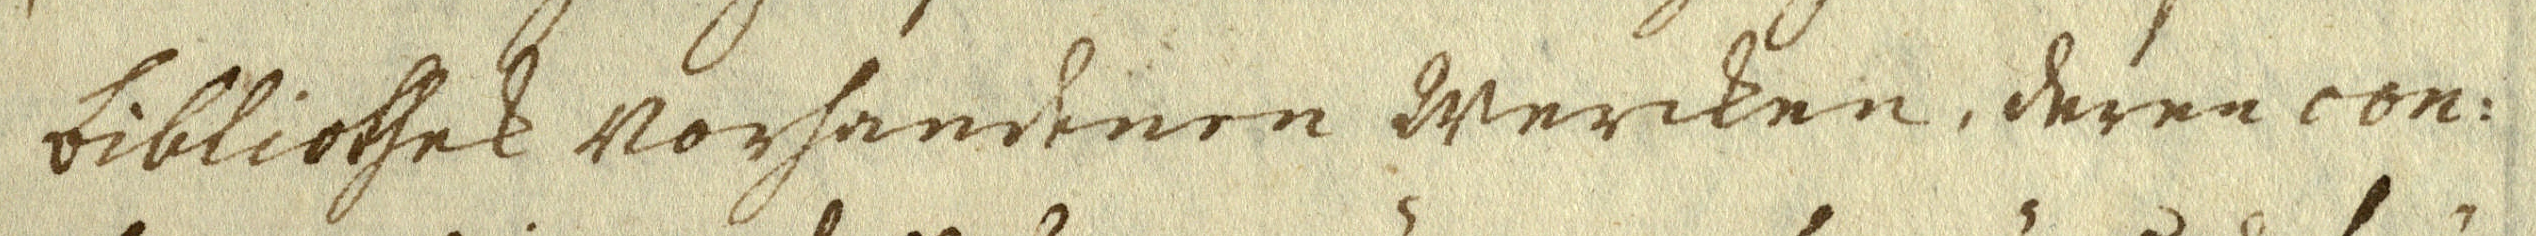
Bibliothek vorhandenen Wercken, deren con¬
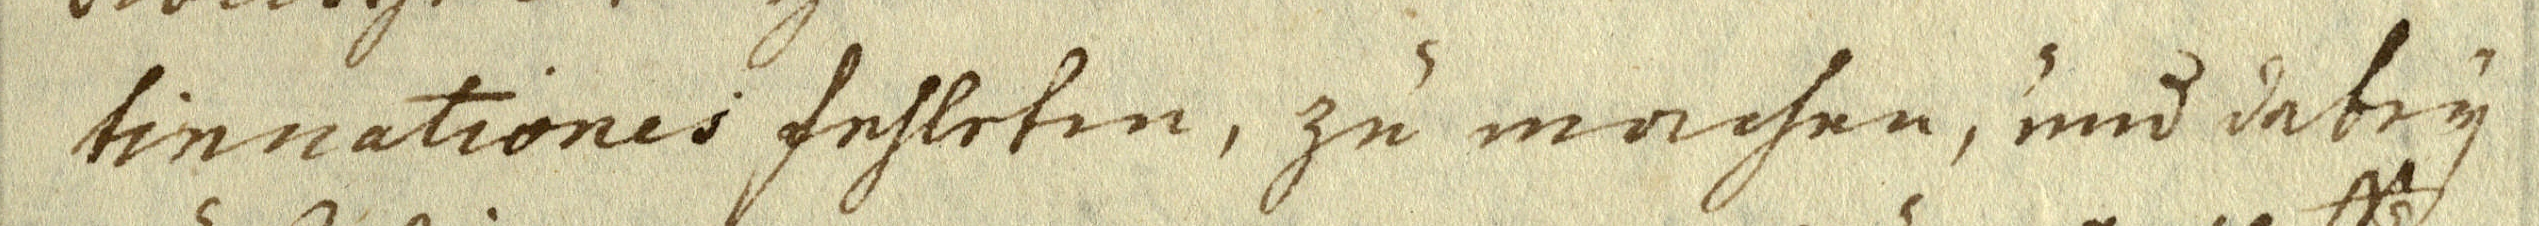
tinnationes fehleten, zu machen, und dabeÿ
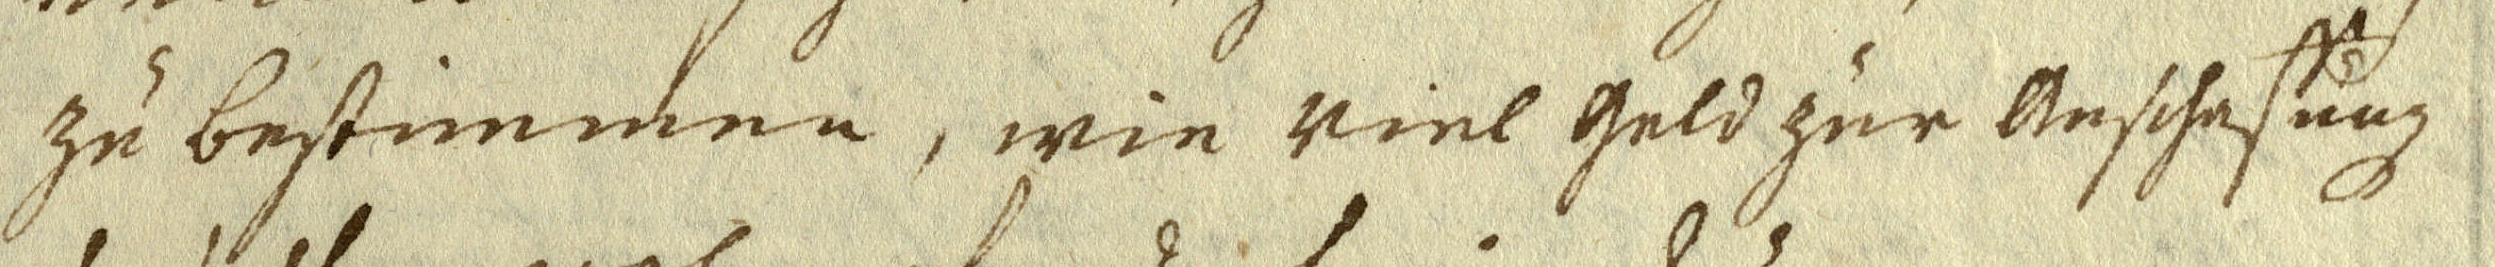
zu bestimmen, wie viel Geld zur Anschaffung
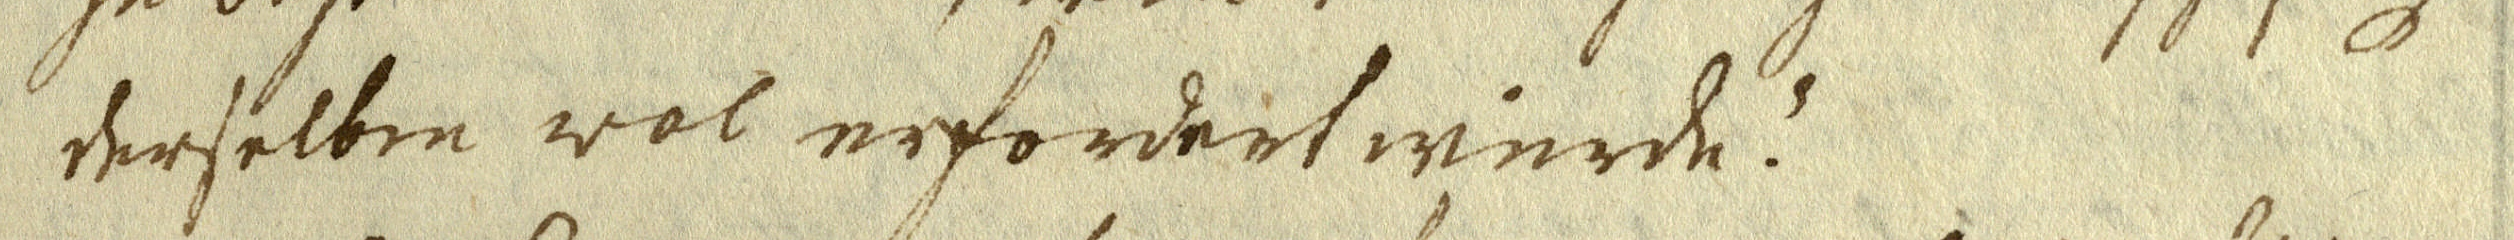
derselben wol erfordert würde?
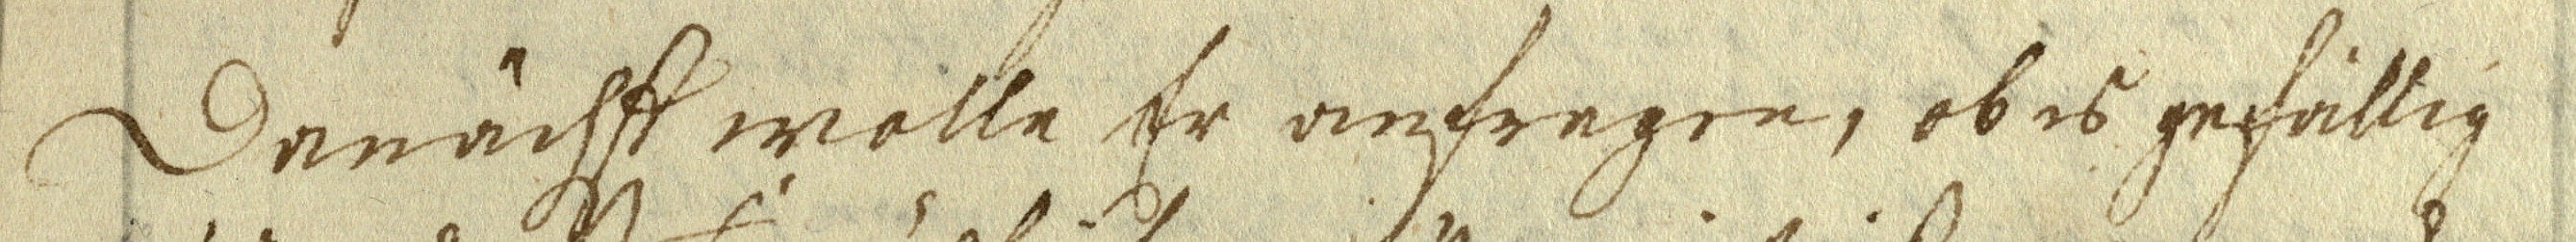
Danächst wolle Er anfragen, ob es gefällig
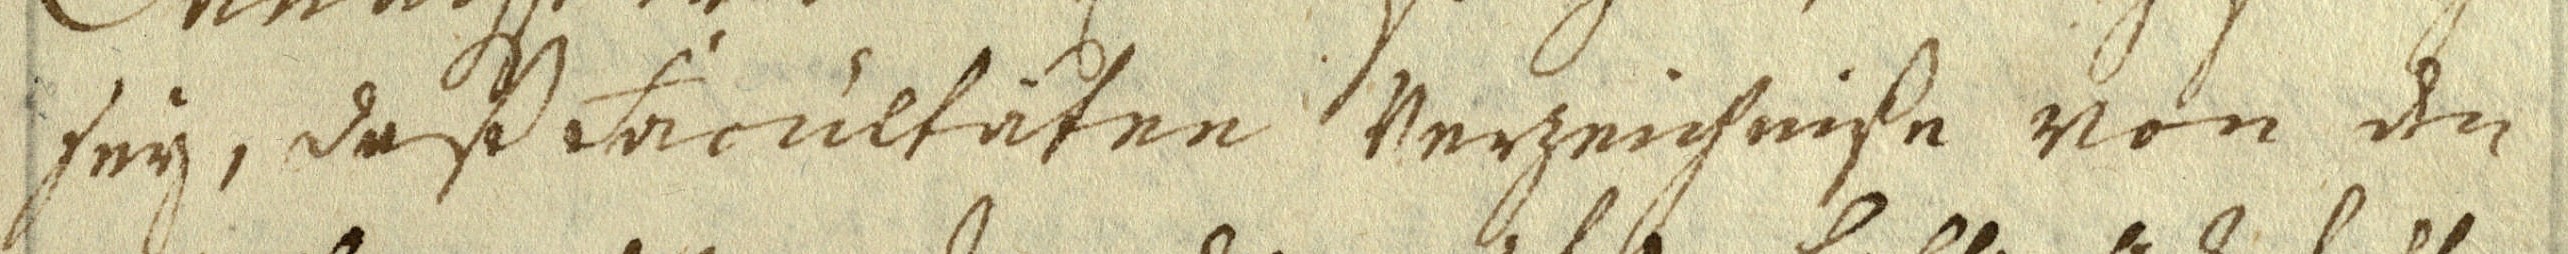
seÿ, daß Facultäten Verzeichniße von den
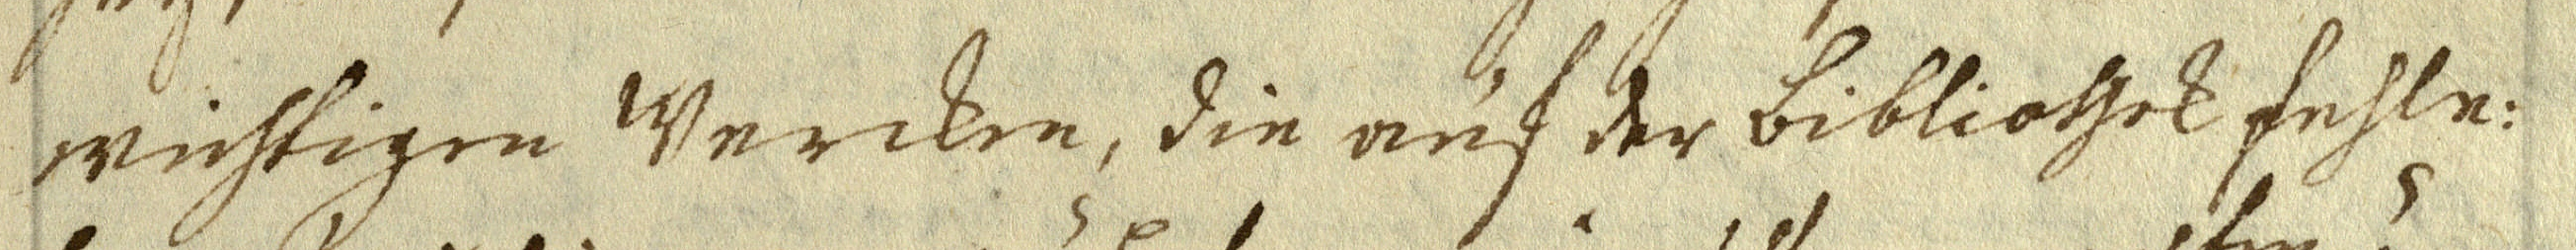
wichtigen Wercken, die auf der Bibibliothek fehle¬
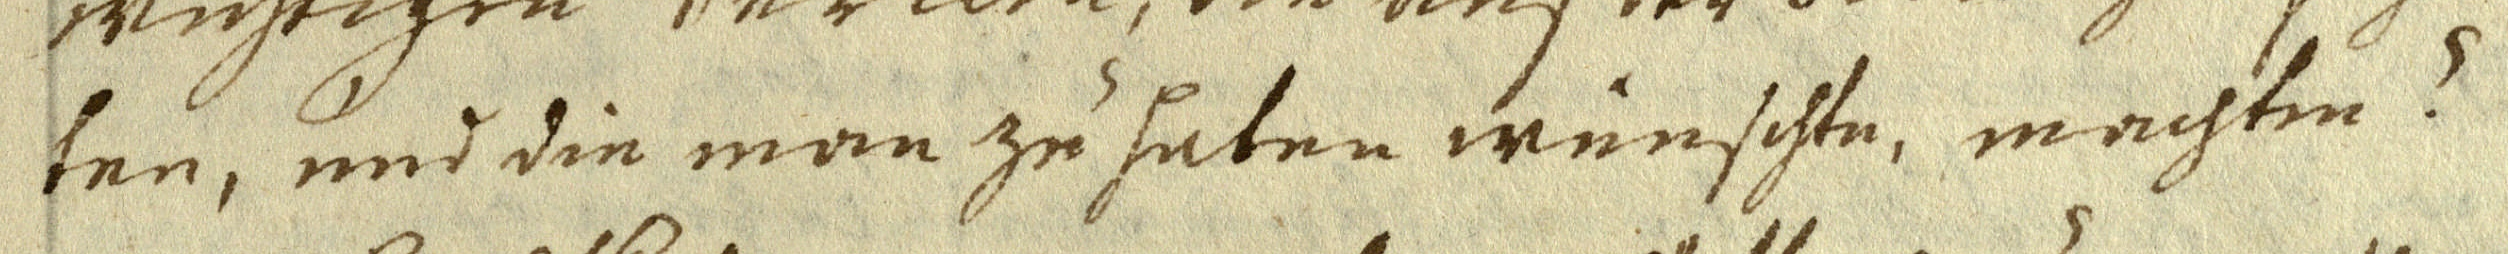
ten, und die man zu haben wünschte, machten?
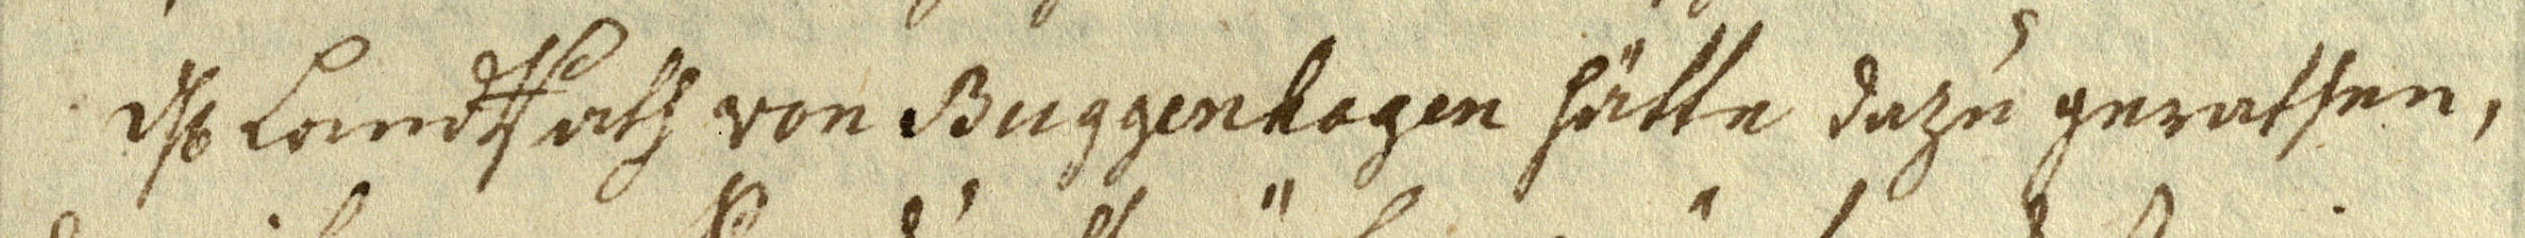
dh LandRath von Buggenhagen hätte dazu gerathen,
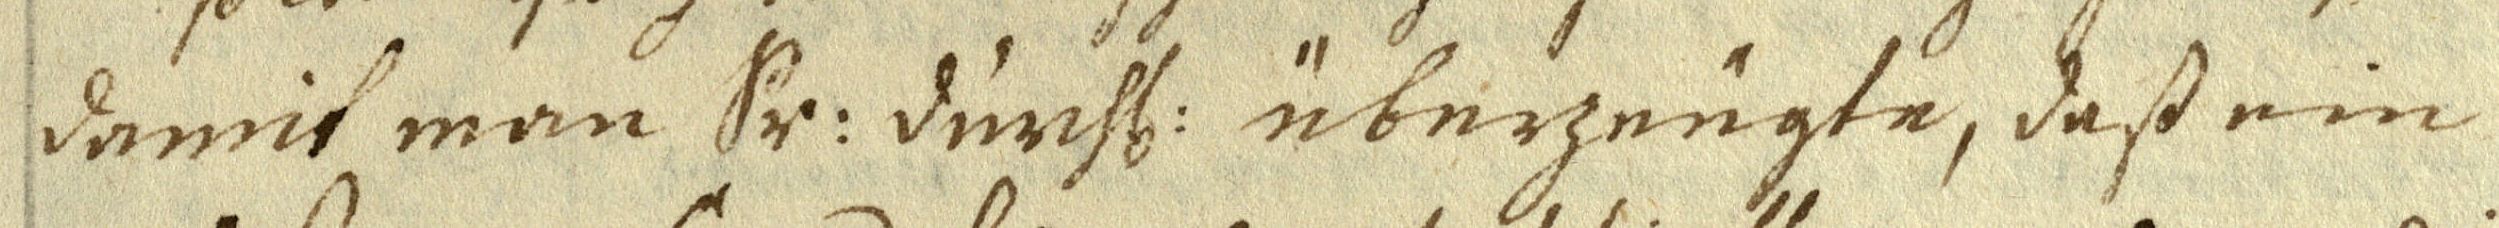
damit man Sr. Durchl. überzeugte, daß ein
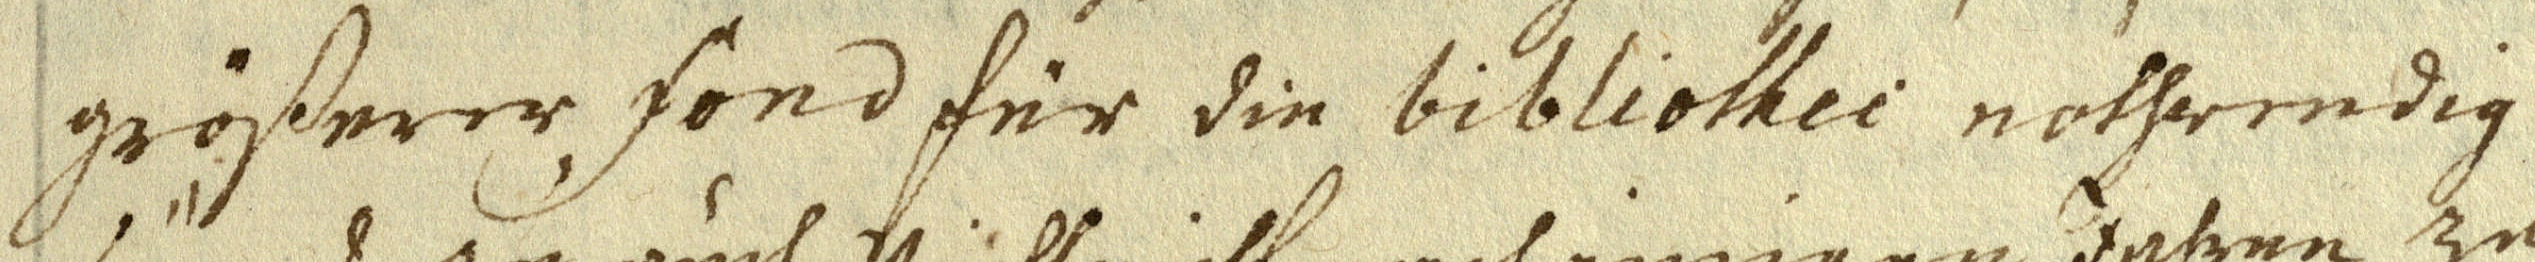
größerer Fond für die bibliothek nothwendig
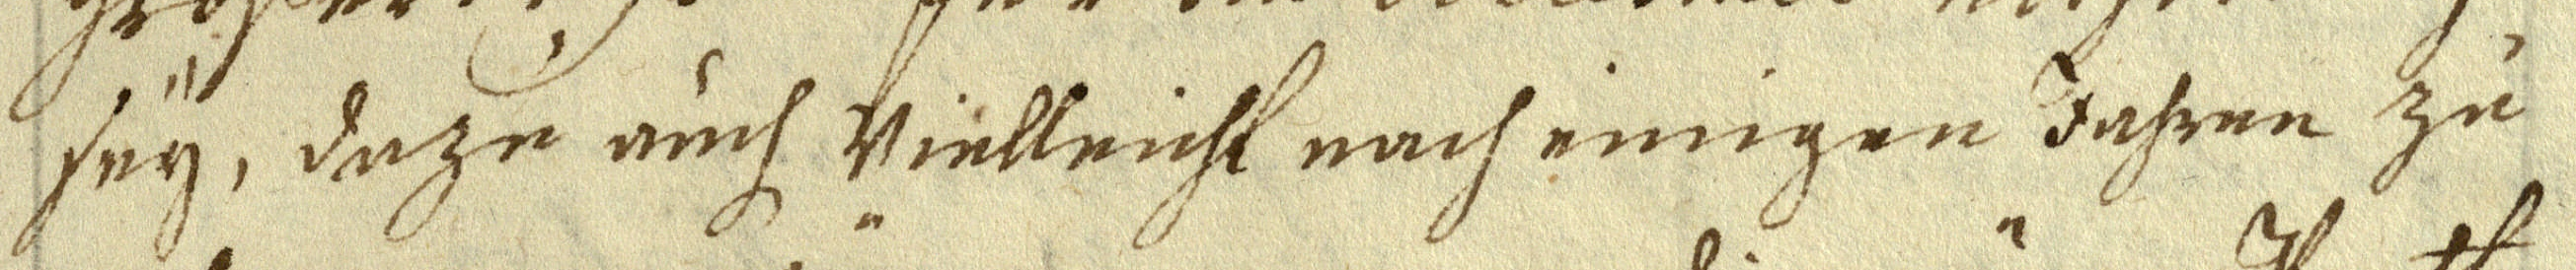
seÿ, dazu auch vielleicht nach einigen Jahren zu
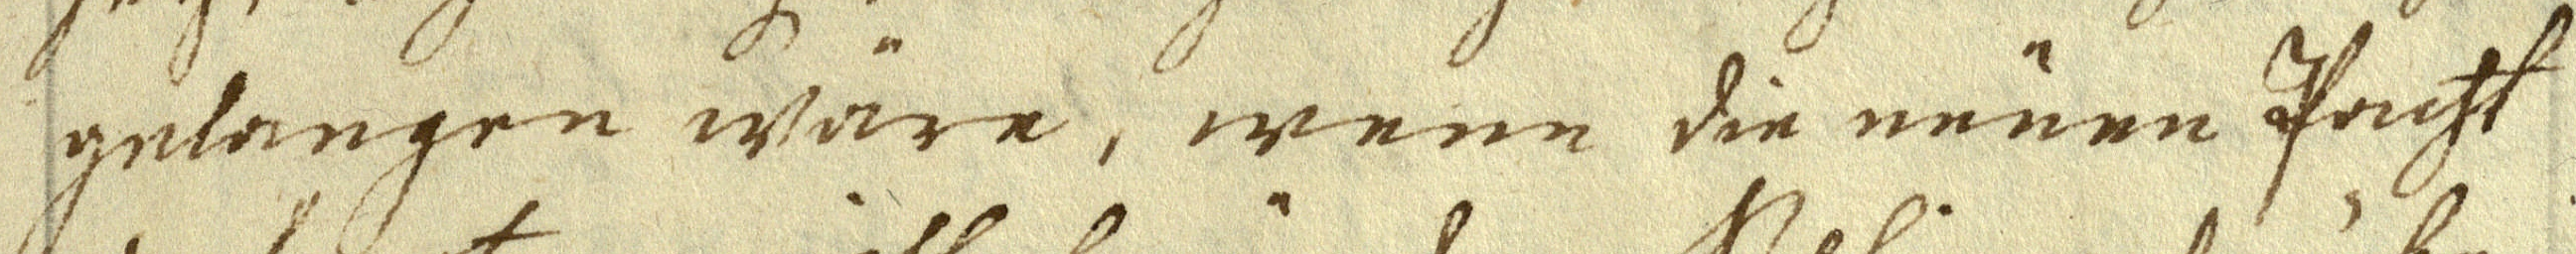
gelangen wäre, wenn die neuen Pacht
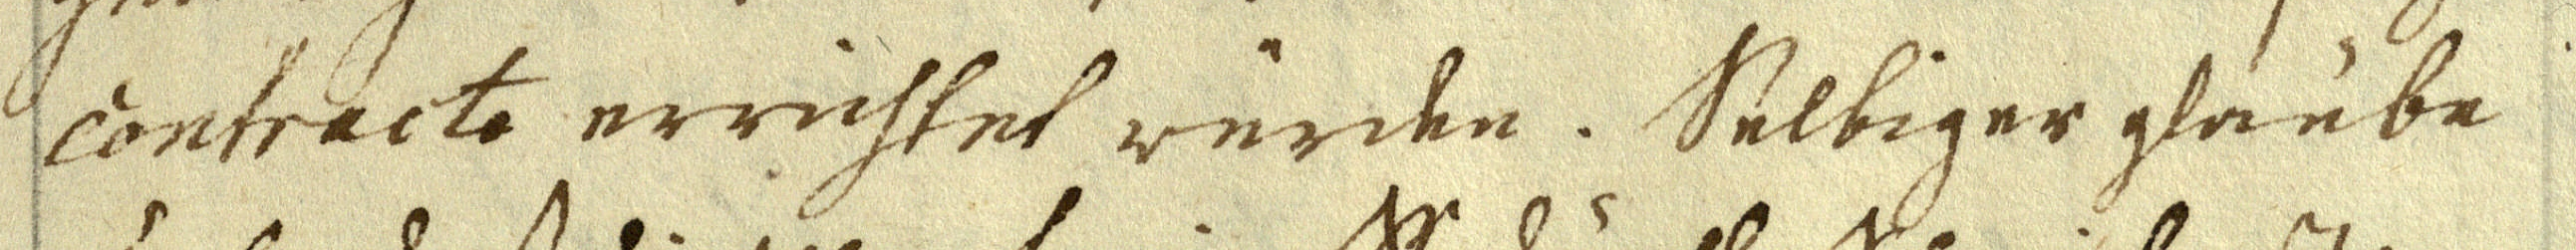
Contracte errichtet würden. Selbiger glaube
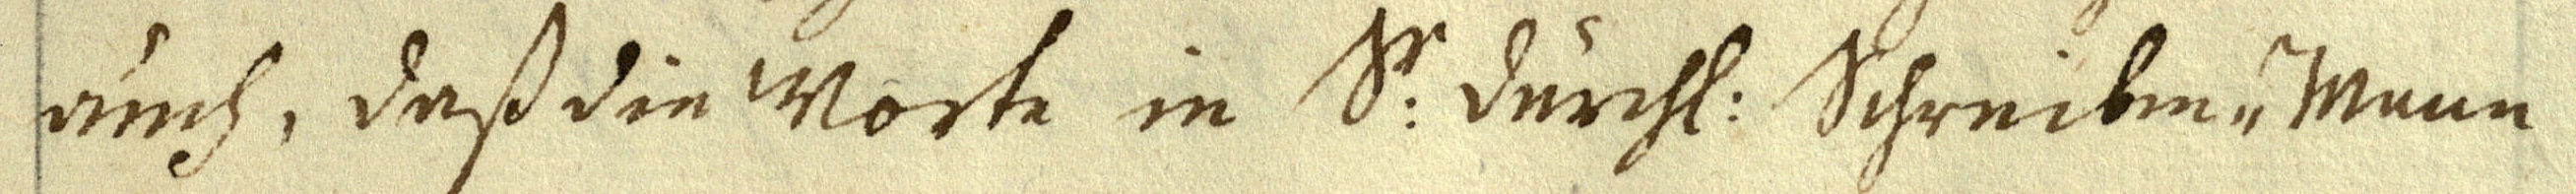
auch, daß die Worte in Sr. Durchl. Schreiben " Mann
